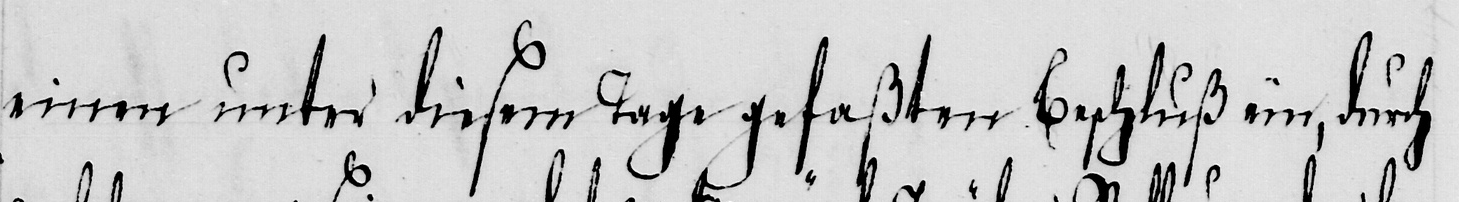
einen unter diesem Tage gefaßten Beschluß ein, durch
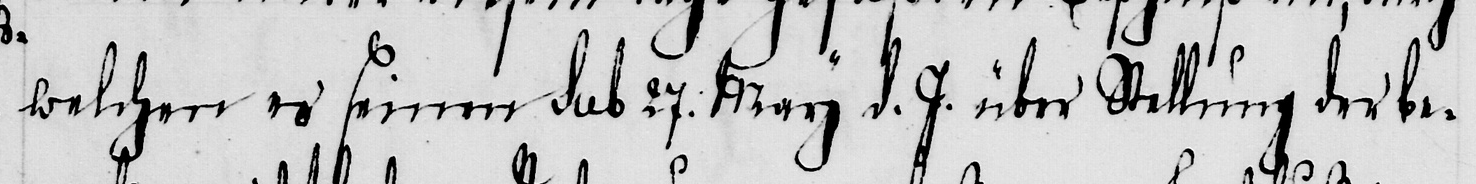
welchen es seinen sub 27. May d. J. über Stellung der be¬
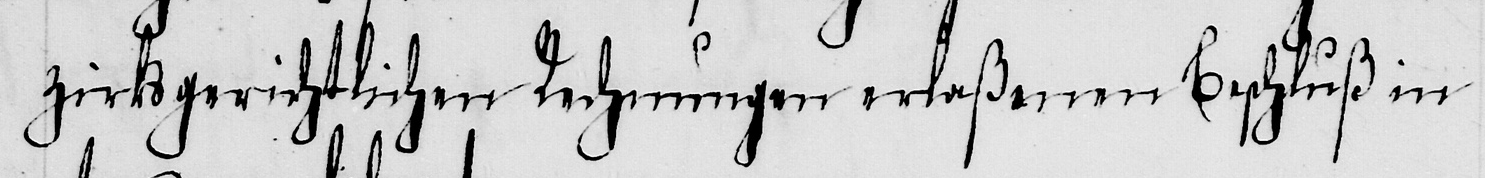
zirksgerichtlichen Rechnungen erlaßenen Beschluß in
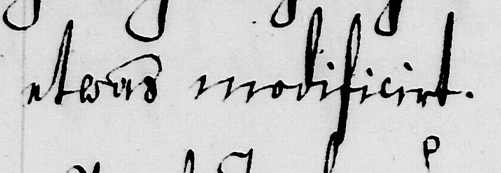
etwas modificirt.
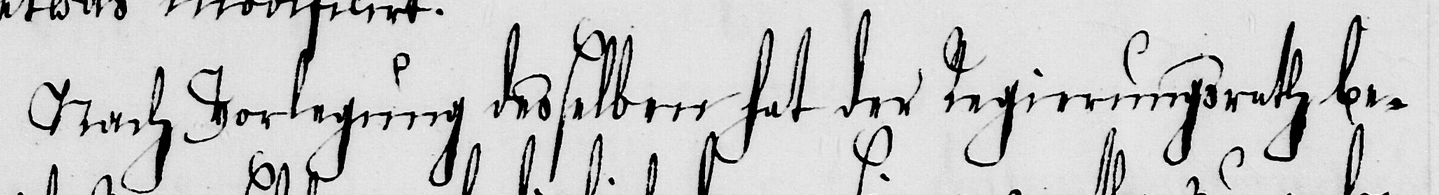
Nach Vorlegung desselben hat der Regierungsrath be¬
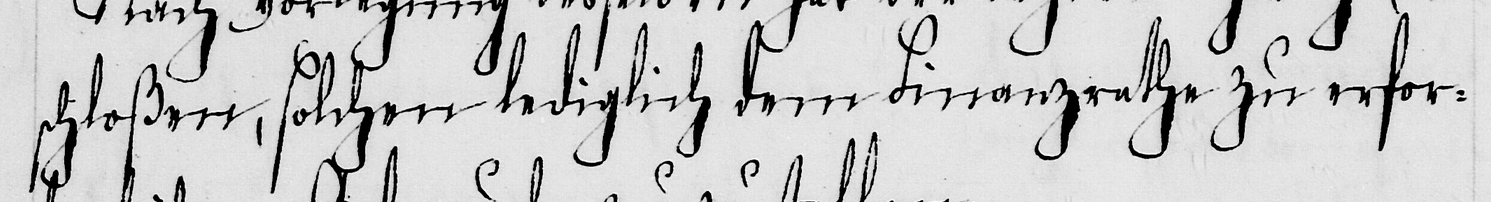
schloßen, solchen lediglich dem Finanzrathe zu erfor¬
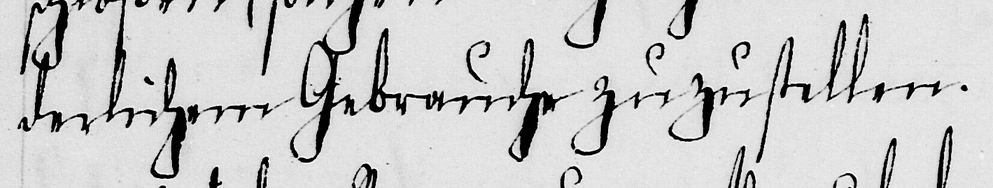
derlichem Gebrauche zuzustellen.
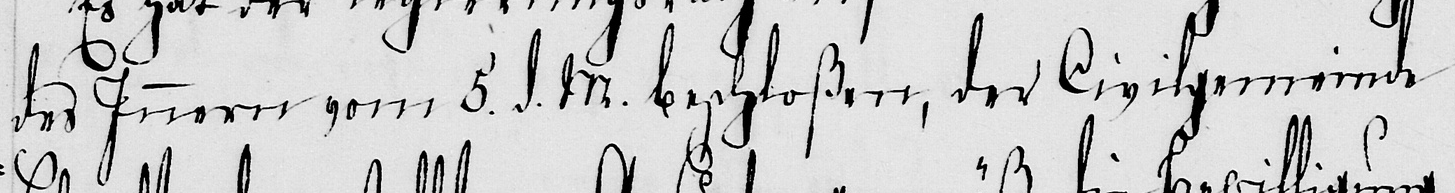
des Innern vom 5. d. M. beschloßen, der Civilgemeinde
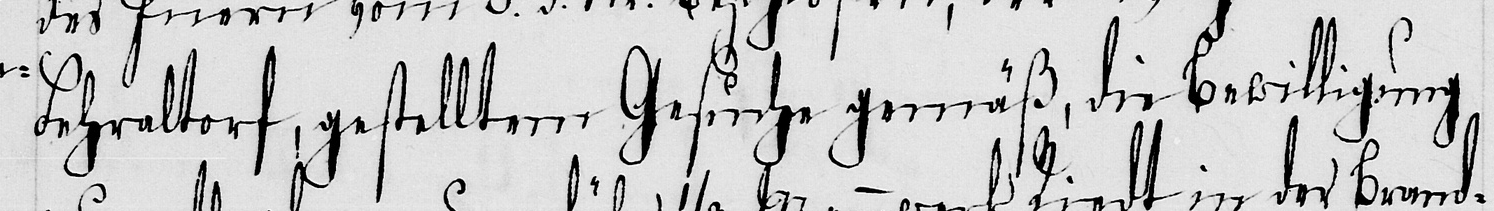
Fehraltorf, gestelltem Gesuche gemäß, die Bewilligung
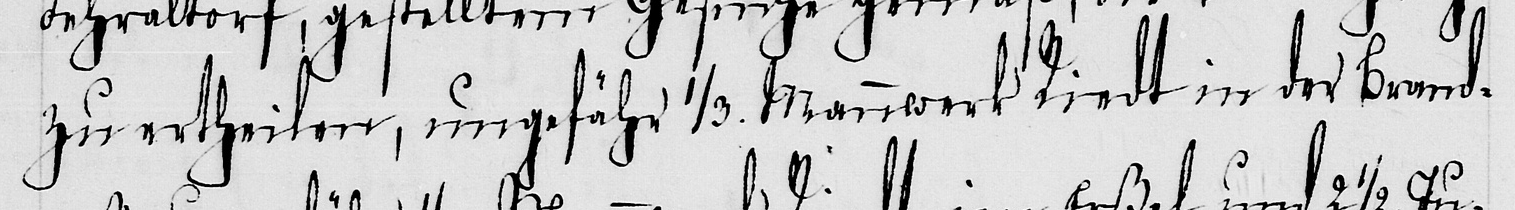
zu ertheilen, ungefähr 1/3 Mannwerk Riedt in der Brand¬
